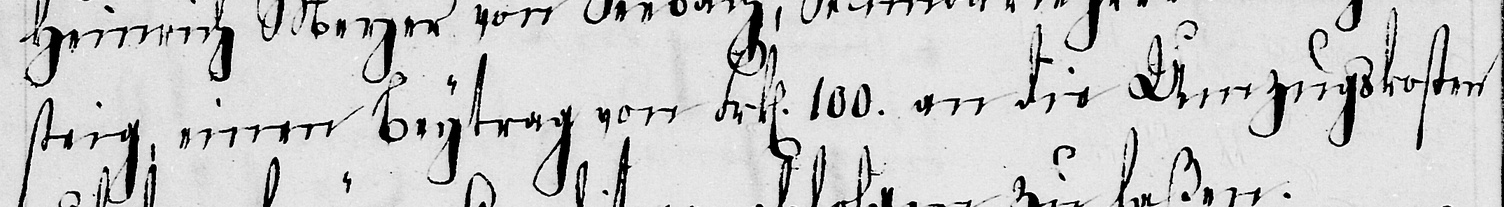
steig, einen Beytrag von Frk[en]. 100. an die Umzugskosten
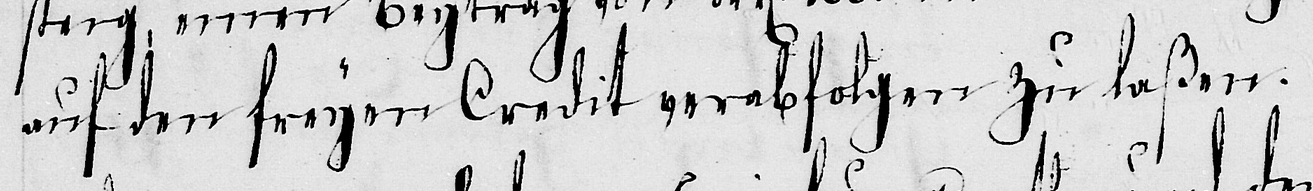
auf den freyen Credit verabfolgen zu laßen.
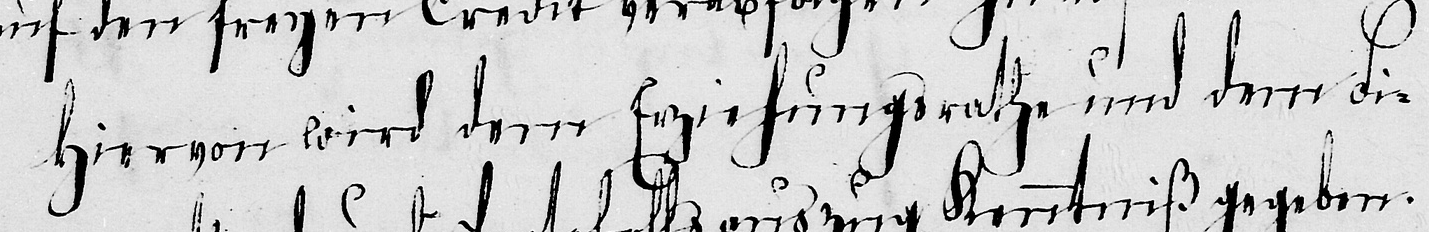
Hiervon wird dem Erziehungsrathe und dem Fi¬
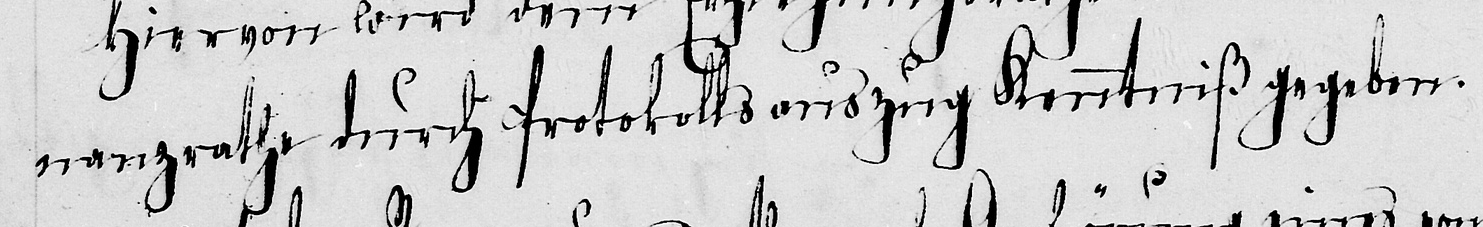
nanzrathe durch Protokollsauszug Kenntniß gegeben.
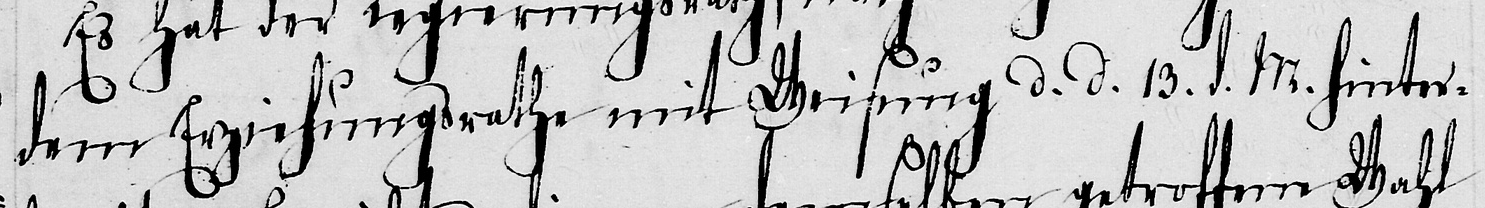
dem Erziehungsrathe mit Weisung d.d. 13. d. M. hinter¬
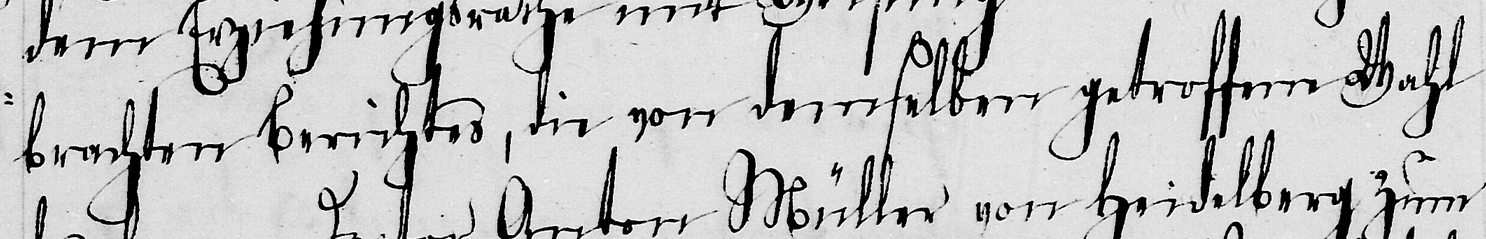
brachten Berichtes, die von demselben getroffene Wahl
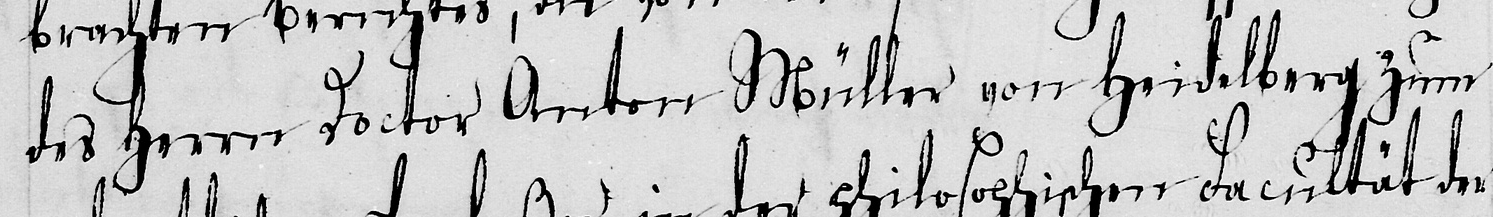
des Herrn Doctor Anton Müller von Heidelberg zum
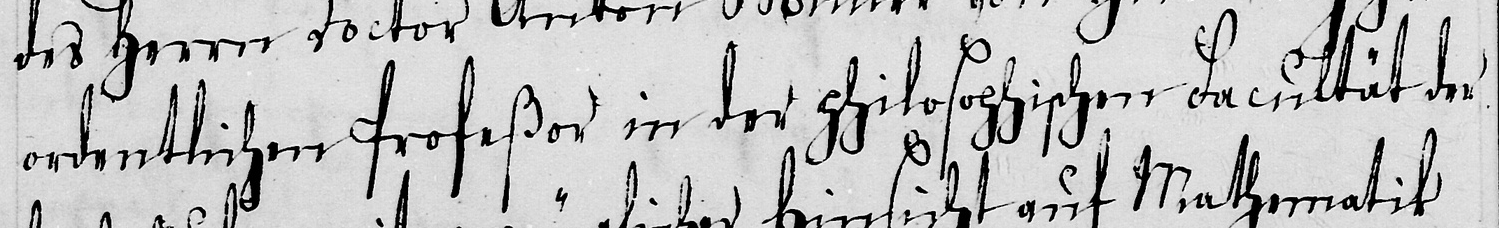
ordentlichen Profeßor in der philosophischen Facultät der
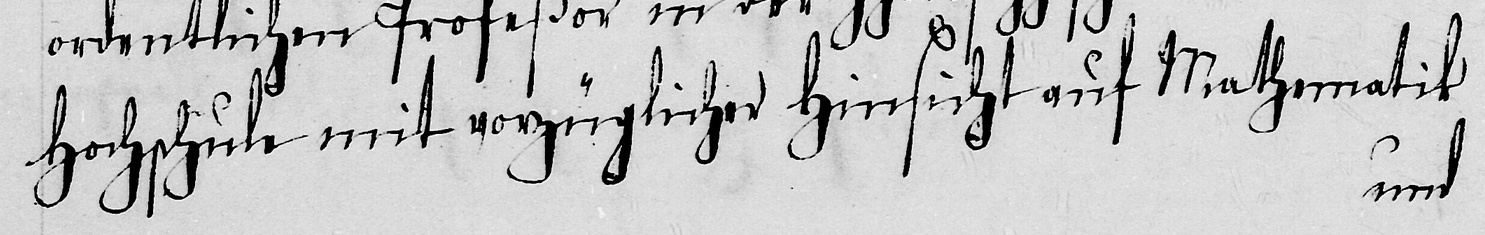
Hochschule mit vorzüglicher Hinsicht auf Mathematik
